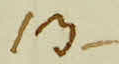13
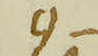9
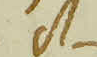8
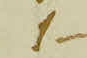1
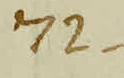72
